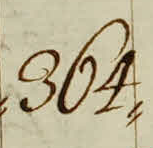364
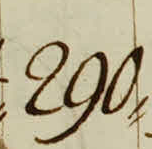290
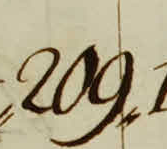209
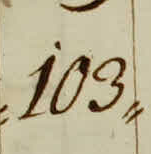103
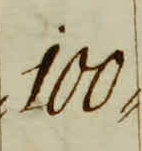100
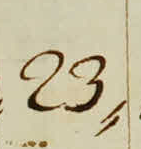23
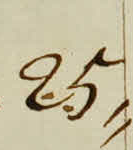25
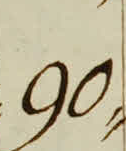90
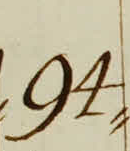94
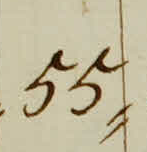55
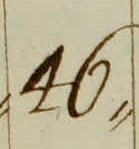46
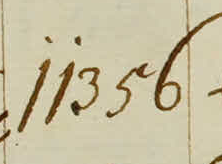11356
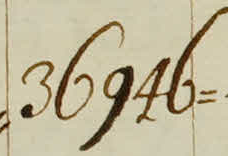36946
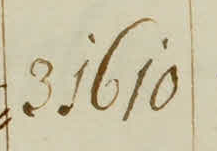31610
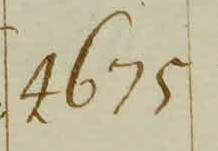4675
